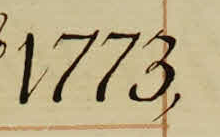1773,
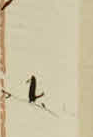1
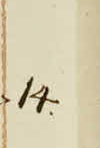14.
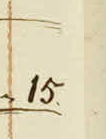15.
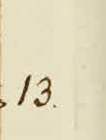13.
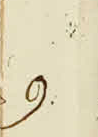9.
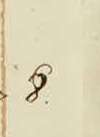8.
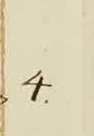4.
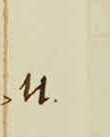11.
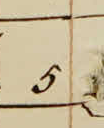5
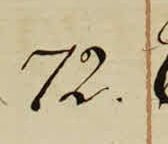72.
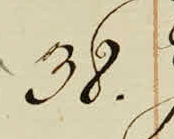38.
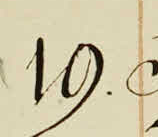19.
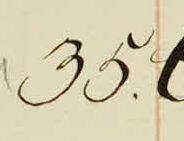35.
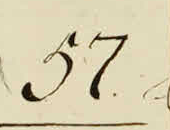57.
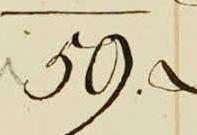59.
